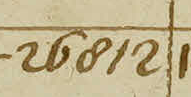26812
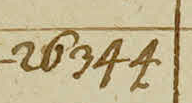26344
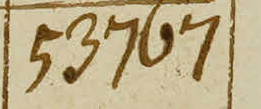53767
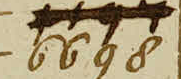6698
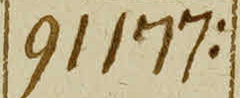91177
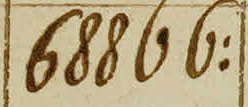68866:
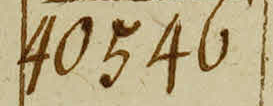40546
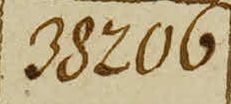38206
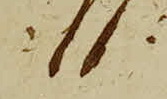11
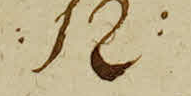12
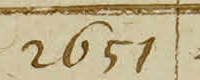2651
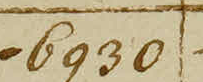6930
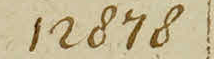12878
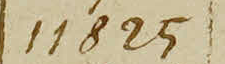11825
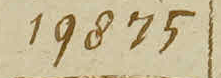19875
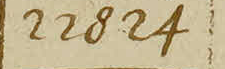22824
